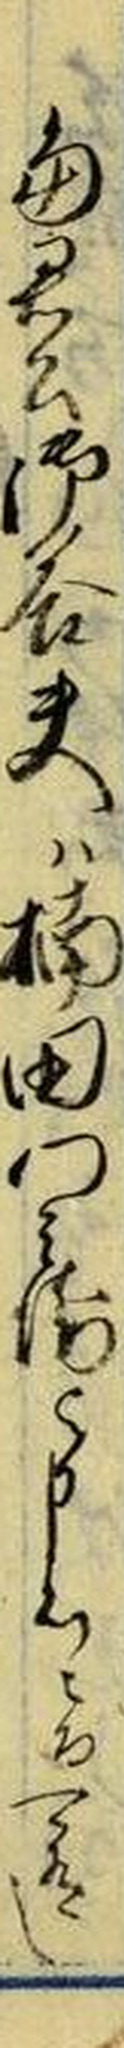当君公御答夫ハ楠田門兵衛と申候ニ而可有之
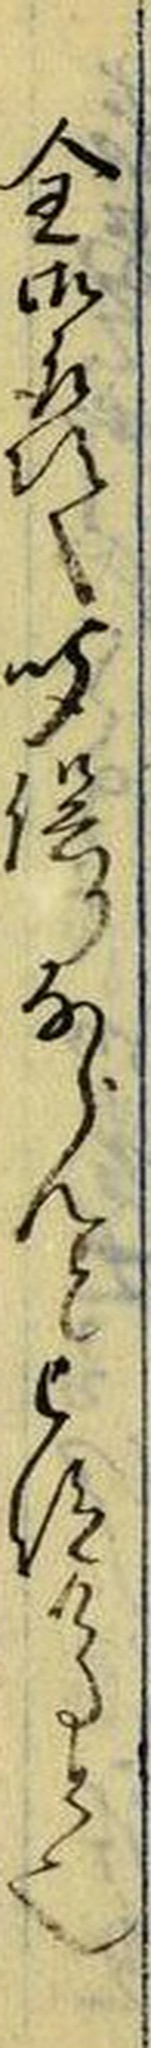全御取次之聞誤りならんと被仰けると也
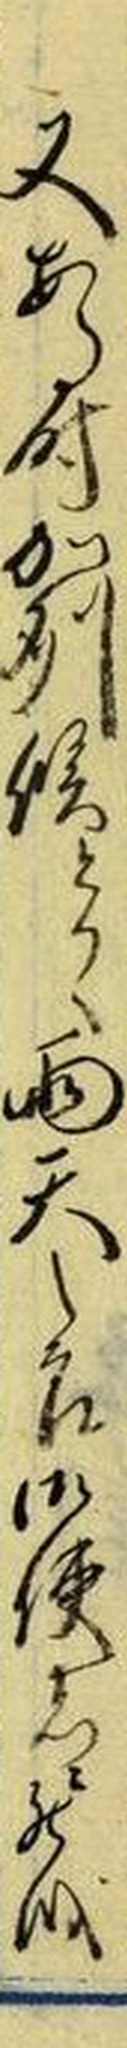又ある時加州候とかへ雨天之節御使者ニ罷越
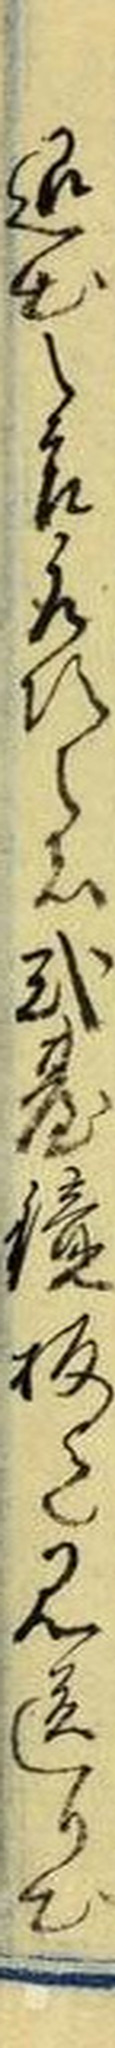退出之節取次之者式台鏡板迄見送り出
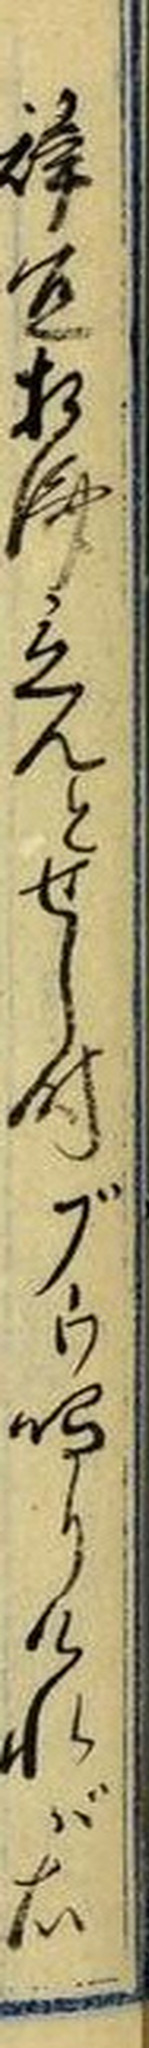辞宜相済立んとせし時ブウ鳴りけれバ右
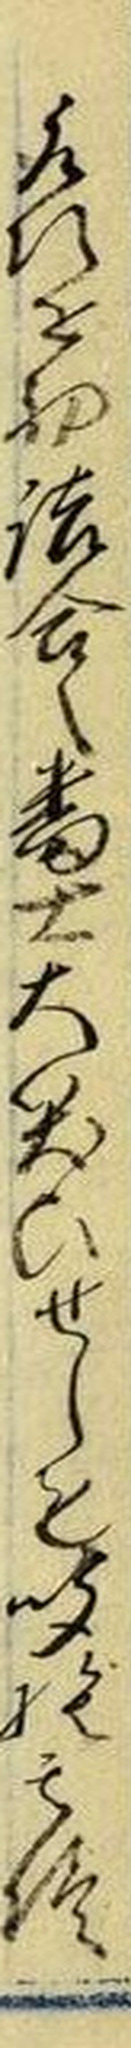取次を初詰合之番士大笑ひせしを聞捨其侭
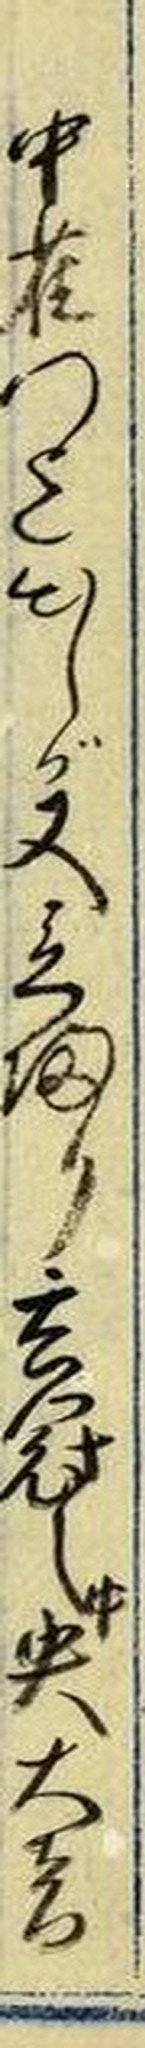中雀門を出しが又立帰り玄冠之中央大音
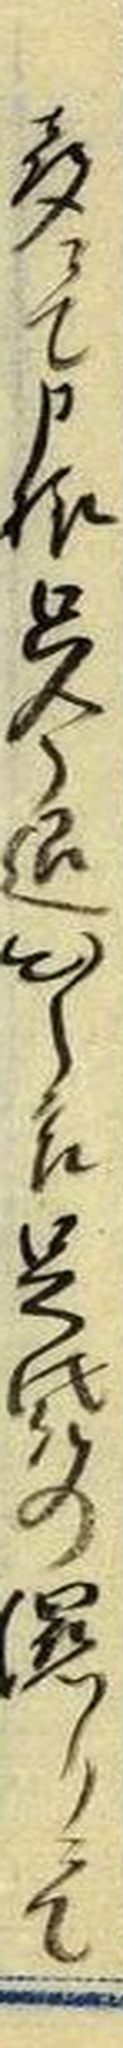声ニて申様只今之退出之節足袋の湿りニて
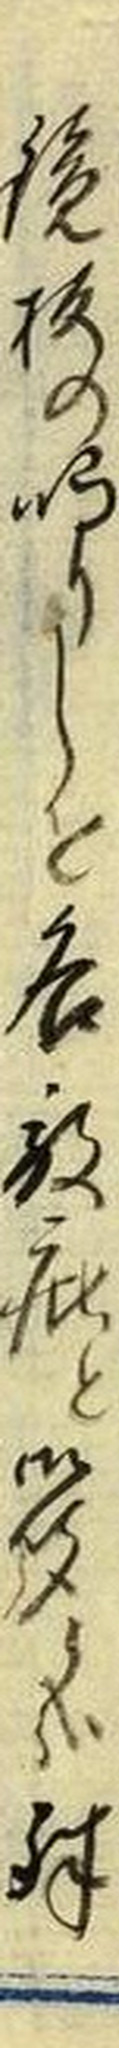鏡板之鳴りしを各放疵と御聞候哉殊
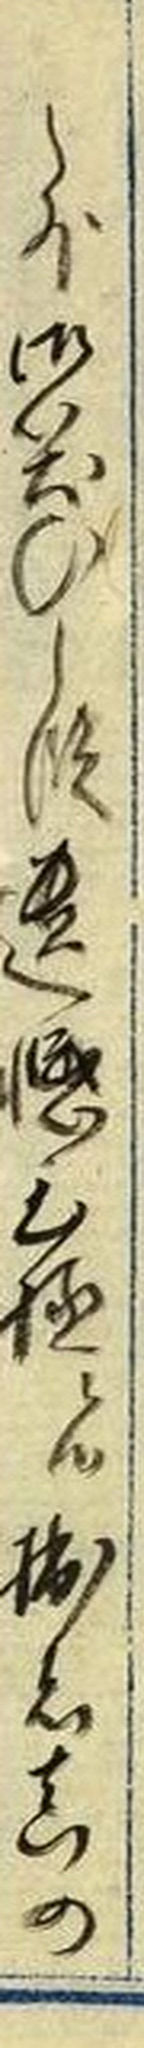之外御笑ひし段遺憾至極ニ候拙者真の
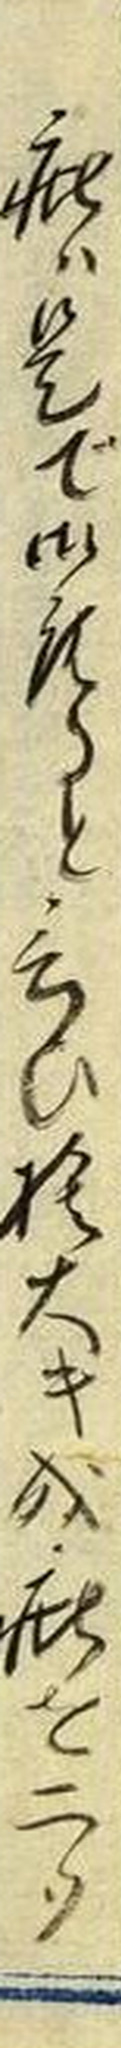疵ハ是で御座ると云ひ捨大キ成疵を二ツ
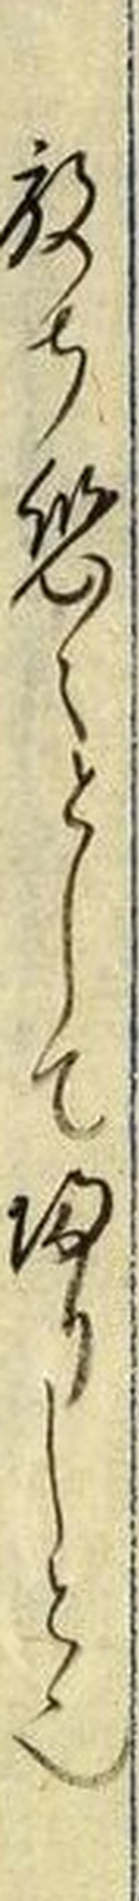放ち悠々として帰りしと也

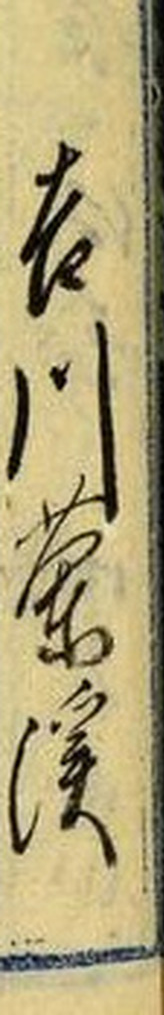吉川蘭渓
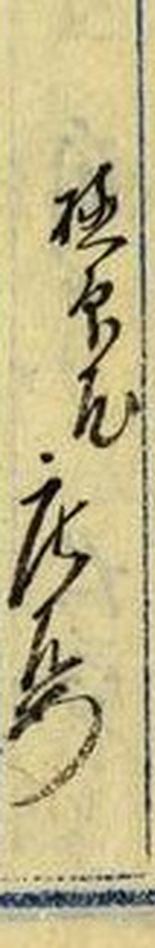極印屋庄左衛門
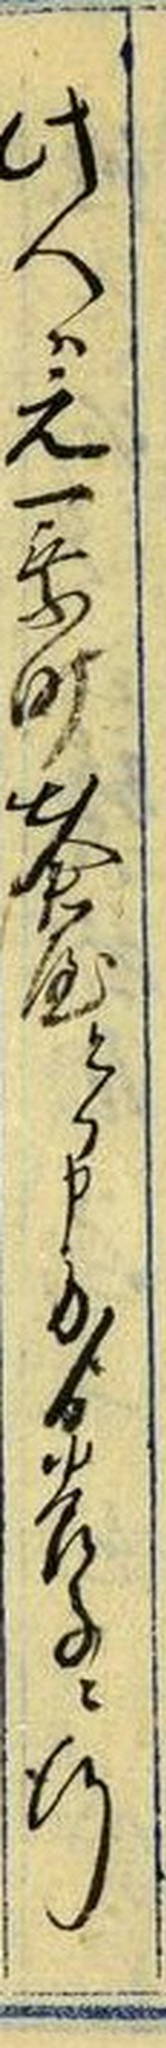此人ハ元一乗町土倉屋とか申方ゟ養子ニ行
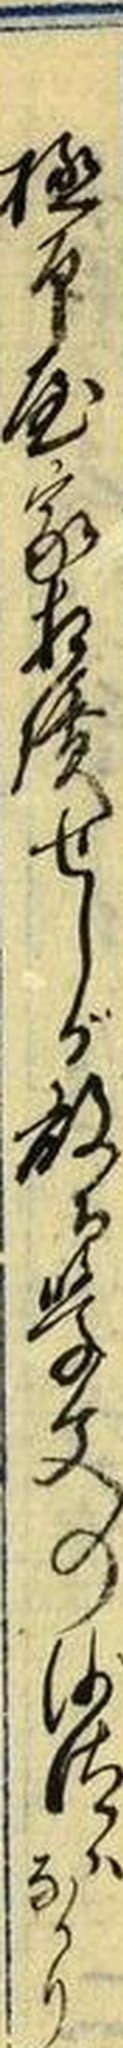極印屋家相続せしが敢而学問の沙汰ハなかり
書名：温古集 三巻
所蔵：福井県文書館 Fukui Prefectural Archives
